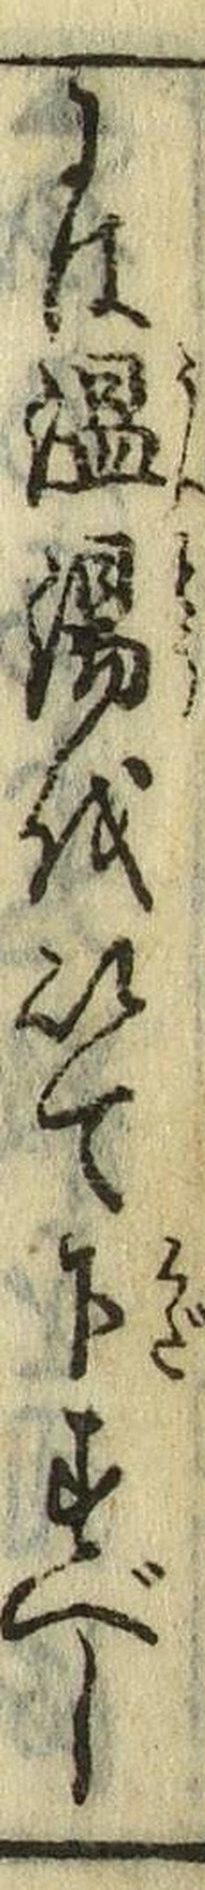には温湯を以て下すべし
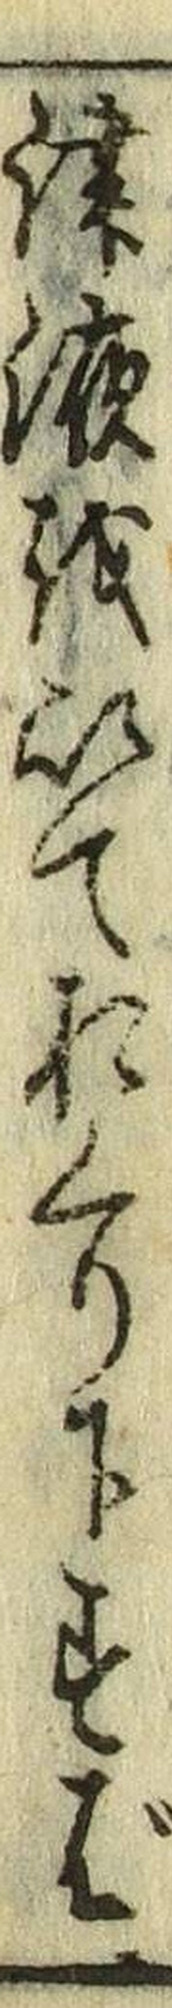津液を以ておくり下すば
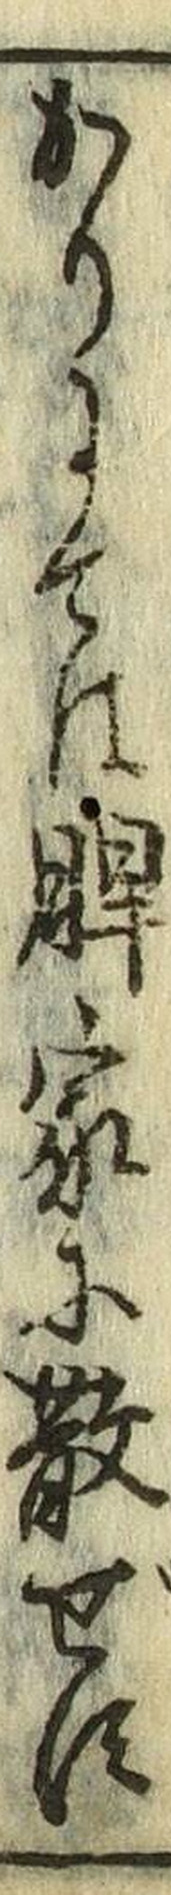かりにては脾家に散ぜす
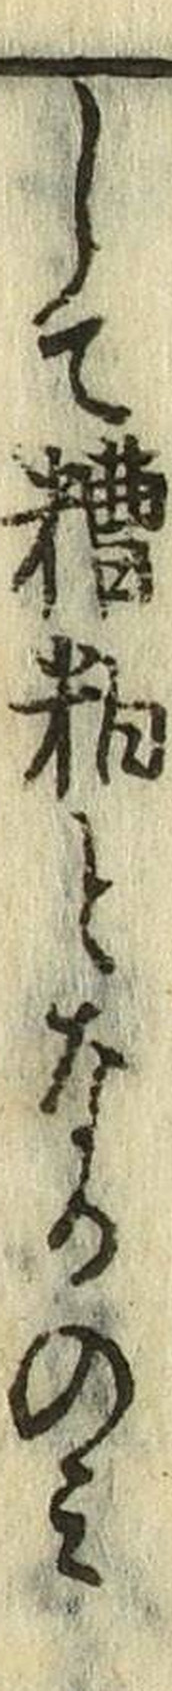して糟粕となるのみ
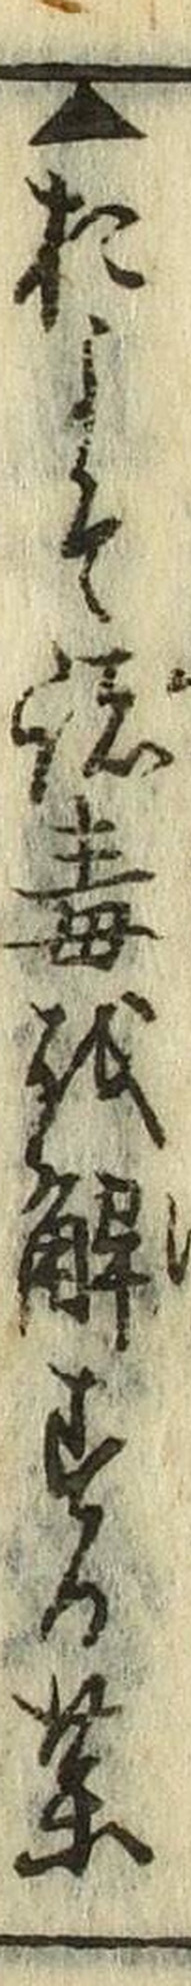▲およそ諸毒を解する薬
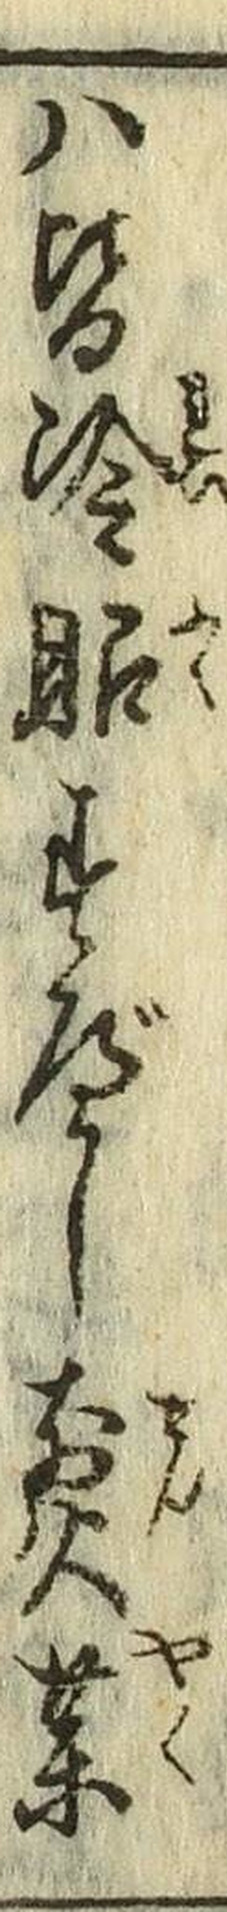は皆冷服すべし煎薬
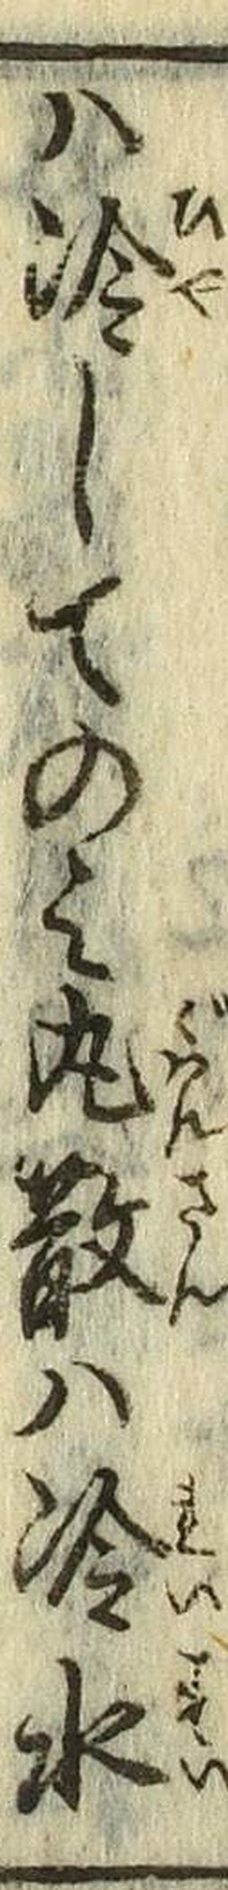は冷してのみ丸散は冷水
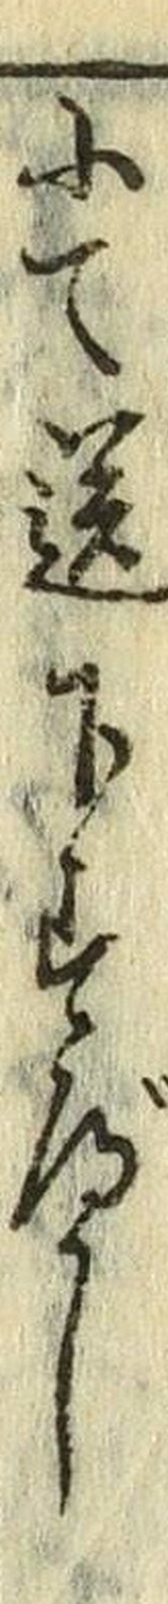にて送下すべし
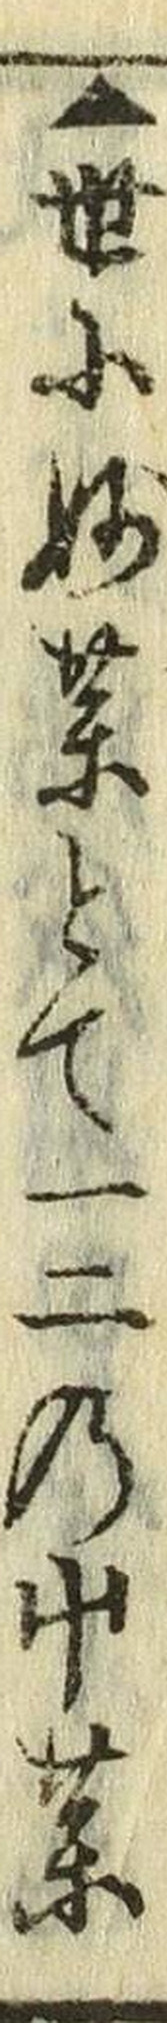▲世に妙薬とて一二の草薬
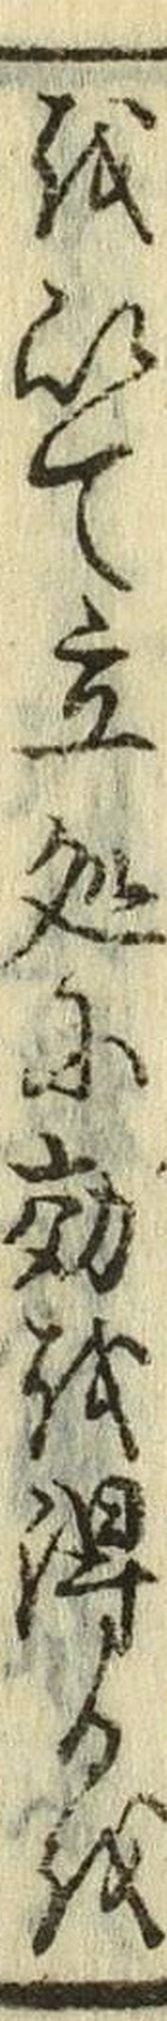を以て立処に効を得るを
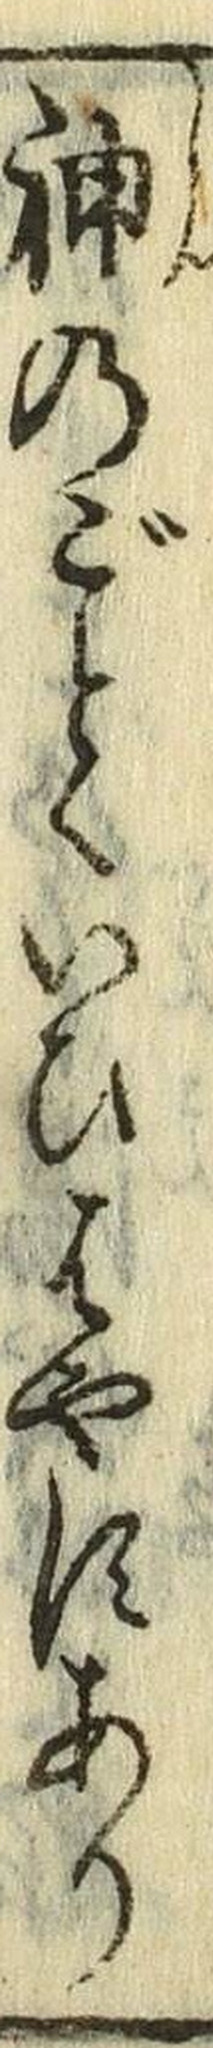神のごとくいひはやすあり
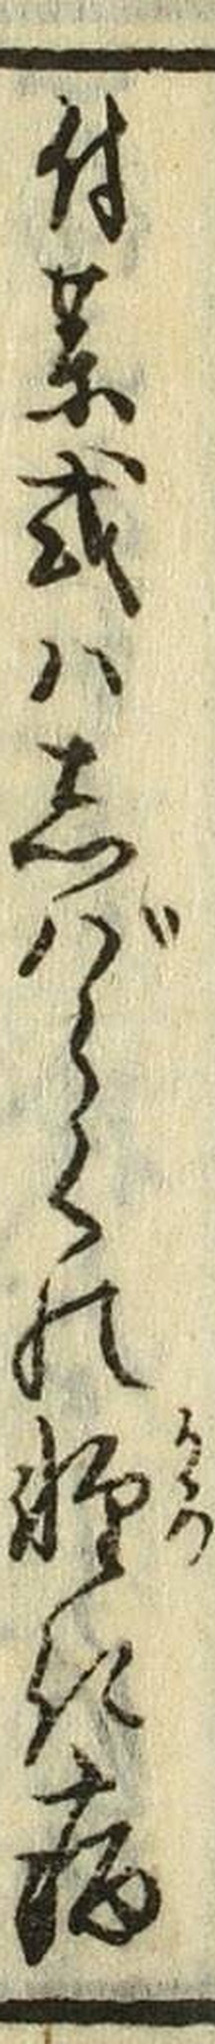付薬或はしばらくの軽き病
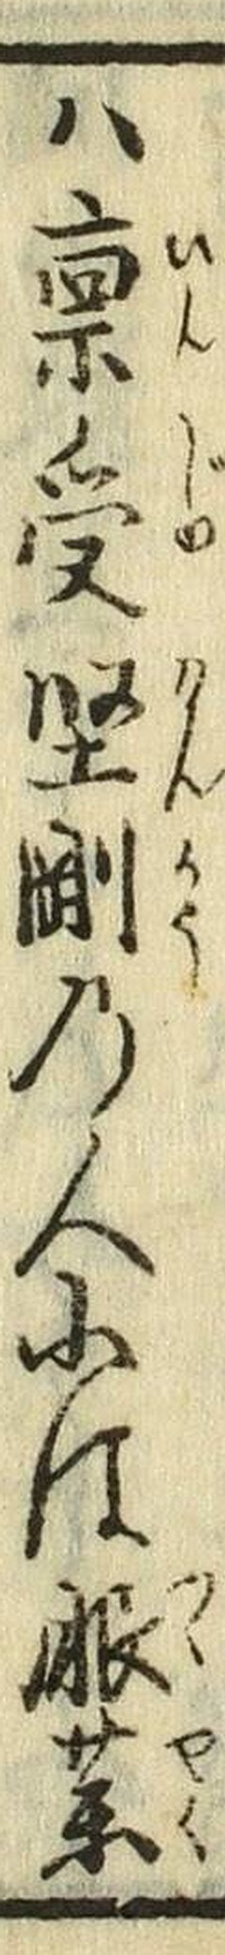は稟受堅剛の人には服薬
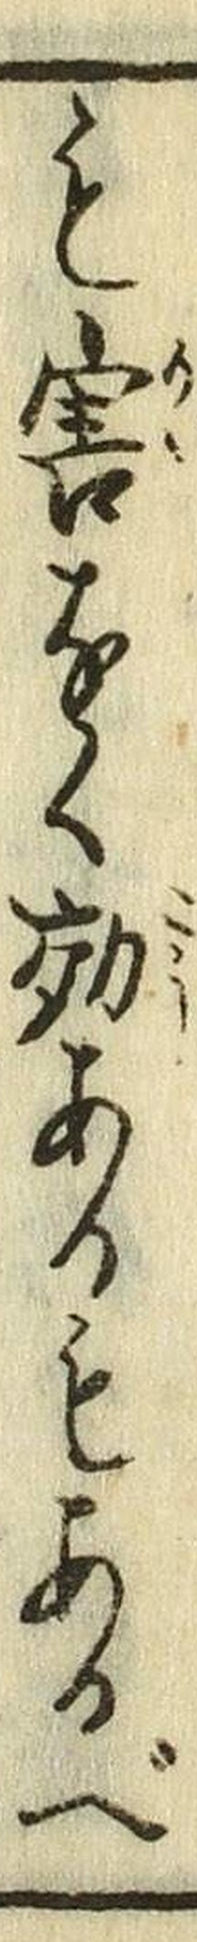も害なく効あるもあるべ
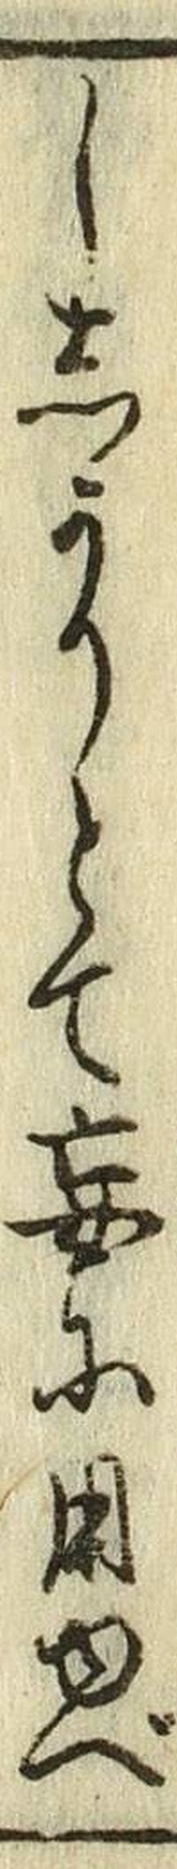ししかりとて妄に用ゆべ
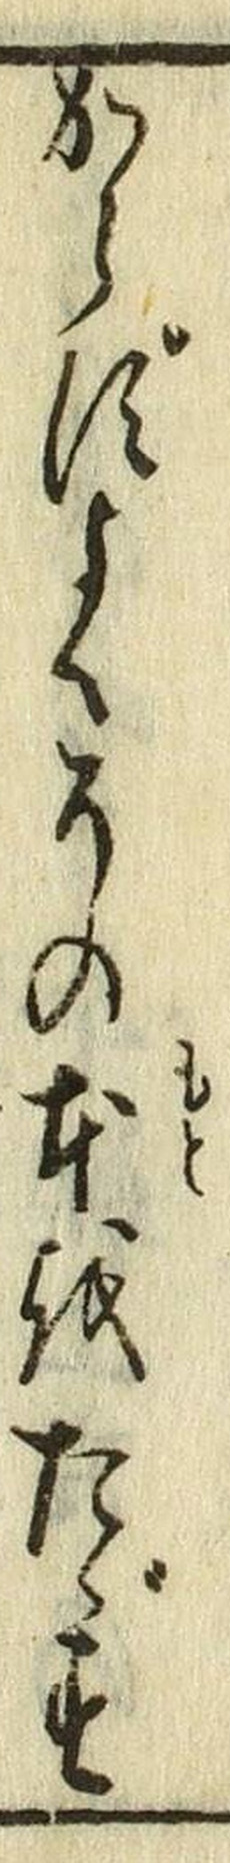からずよくその本をたゞす
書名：居家養生記
